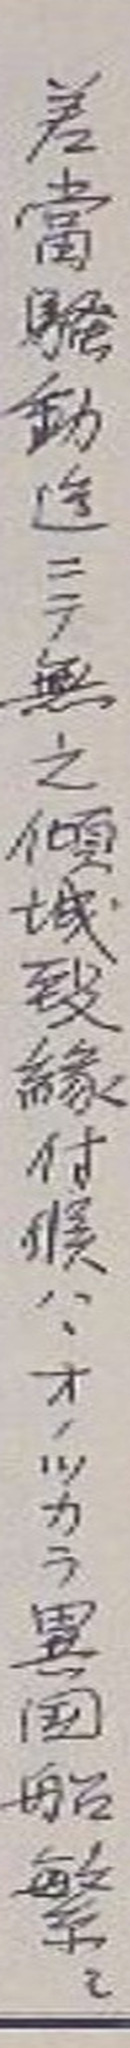差当騒動迄にて無之傾城致縁付候はゝおのつから異国船繁々
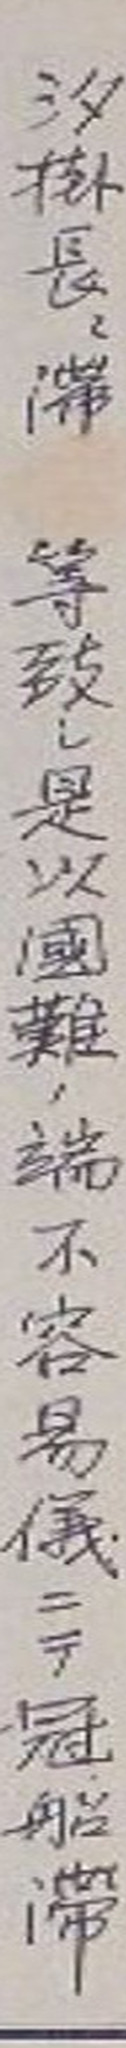汐掛長々滞等致し是以国難の端不容易儀にて冠船滞
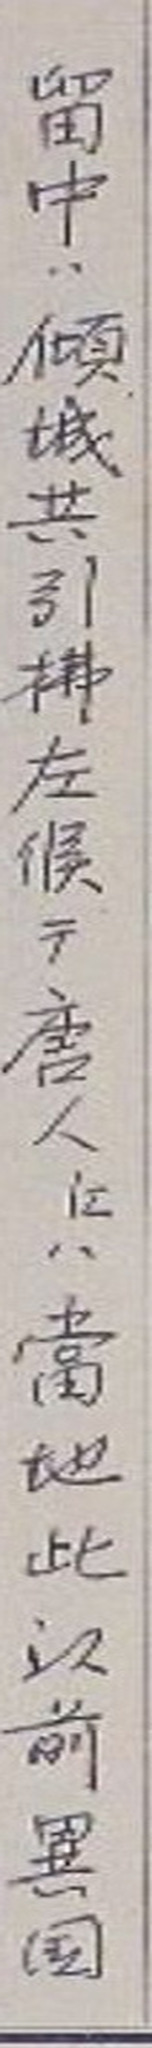留中は傾城共引払左候て唐人えは当地此以前異国
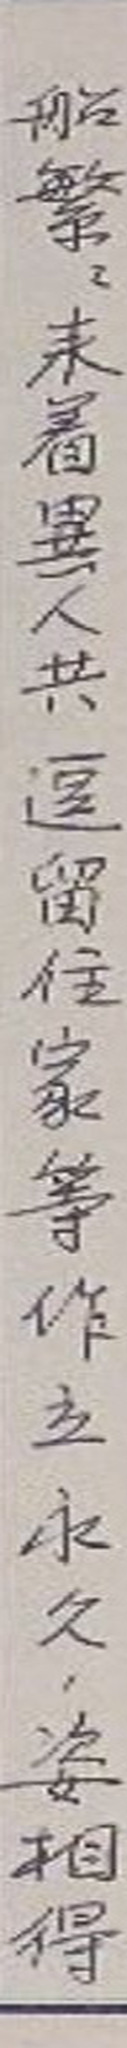船繁々来着異人共逗留住家等作立永久の姿相得

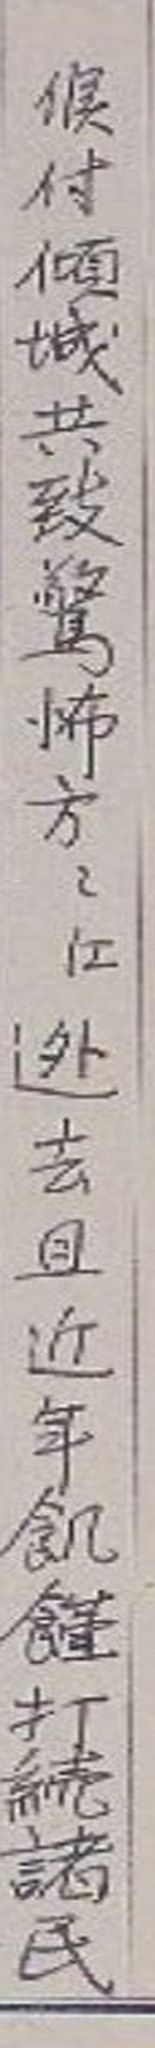候付傾城共致驚怖方々え逃去且近年飢饉打続諸民
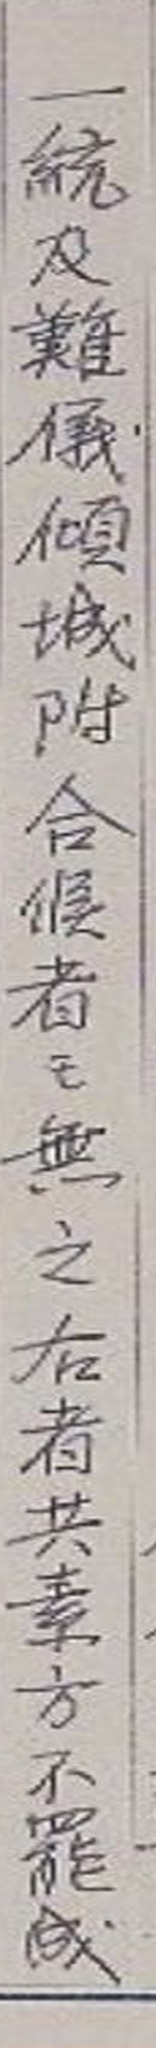一統及難儀傾城附合候者も無之右者共素方不罷成
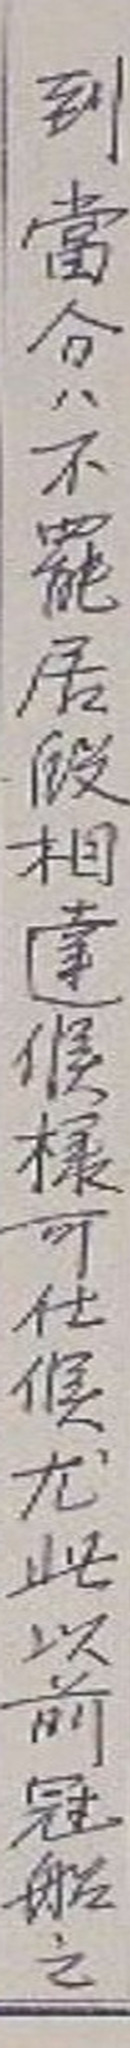到当分は不罷居段相達候様可仕候尤此以前冠船之
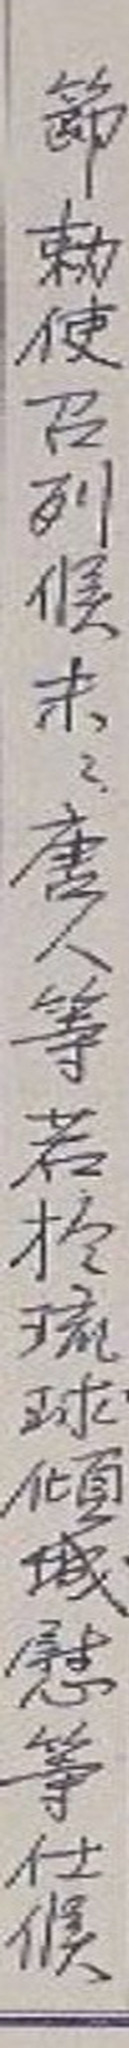節勅使召列候末々唐人等若於琉球傾城慰等仕候
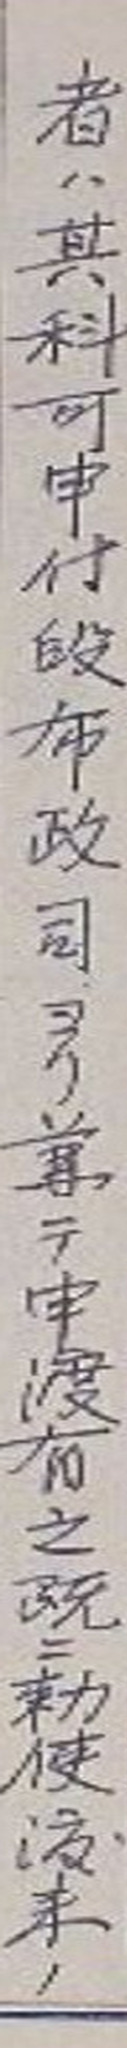者は其科可申付段布政司より兼て申渡有之既に勅使渡来の
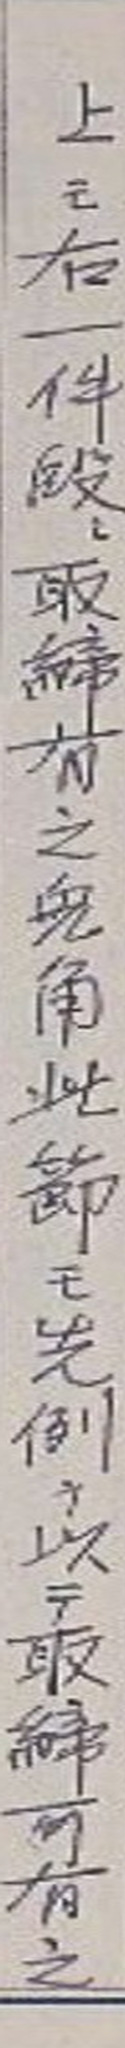上も右一件段々取締有之兎角此節も先例を以て取締可有之
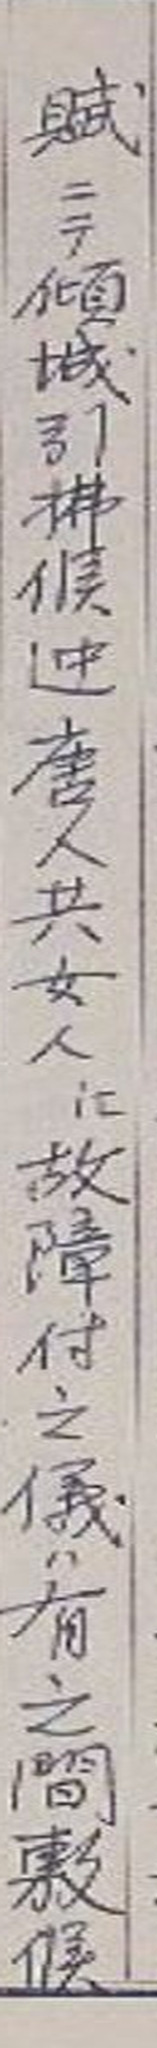賦にて傾城引払候迚唐人共女人え故障付之儀は有之間敷候
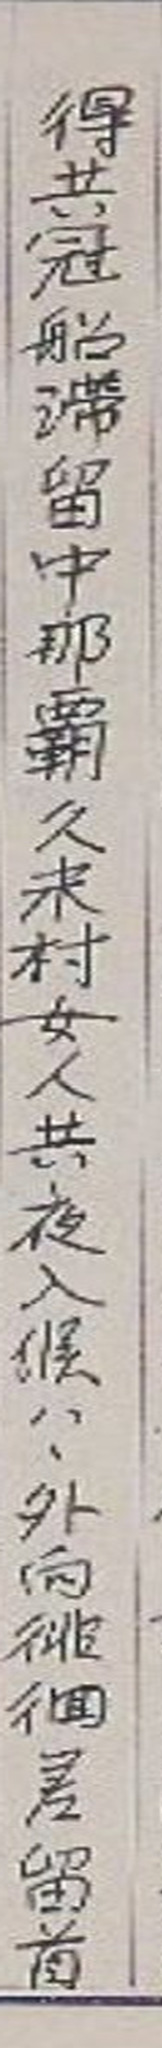得共冠船滞留中那覇久米村女人共夜入候はゝ外向徘徊差留首
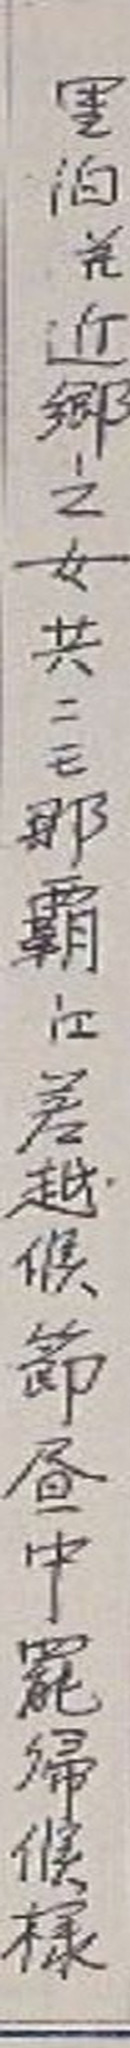里泊并近郷之女共にも那覇え差越候節昼中罷帰候様
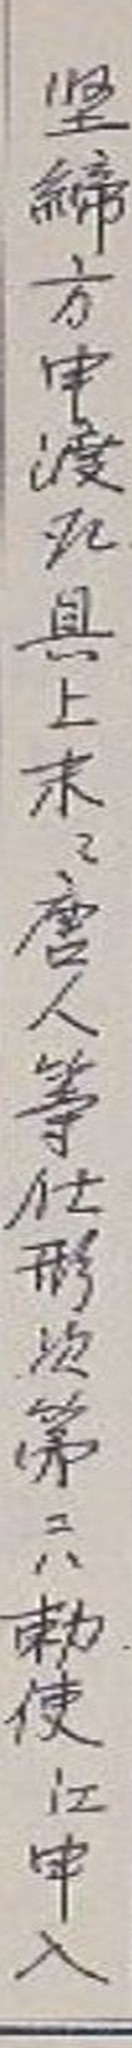堅締方申渡候其上末々唐人等仕形次第には勅使え申入
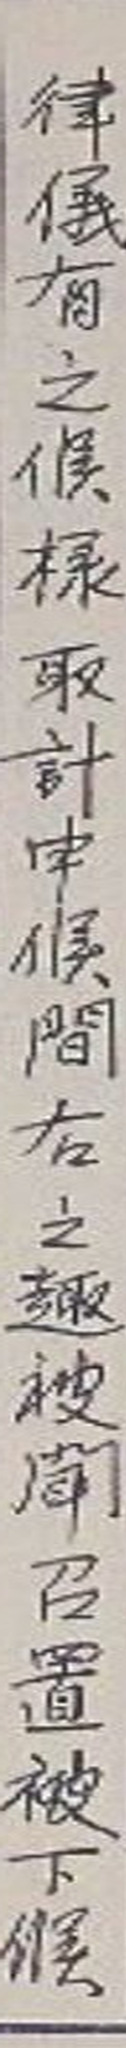律儀有之候様取計申候間右之趣被聞召被下候
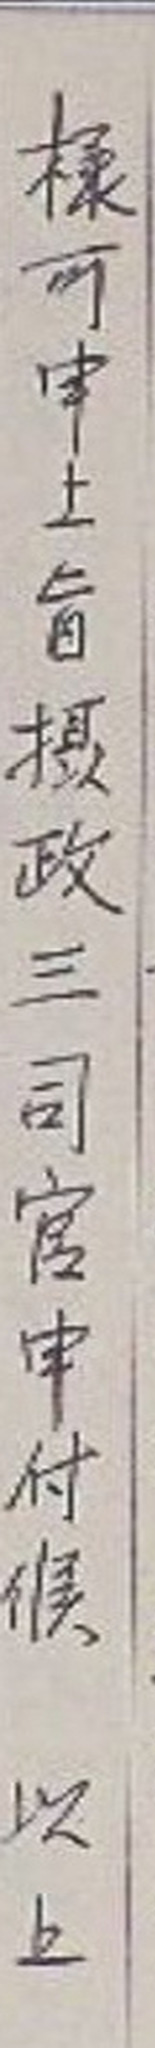様可申上旨摂政三司官申付候以上
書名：支那冊封使来琉諸記 下巻
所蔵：University of the Ryukyus Library
